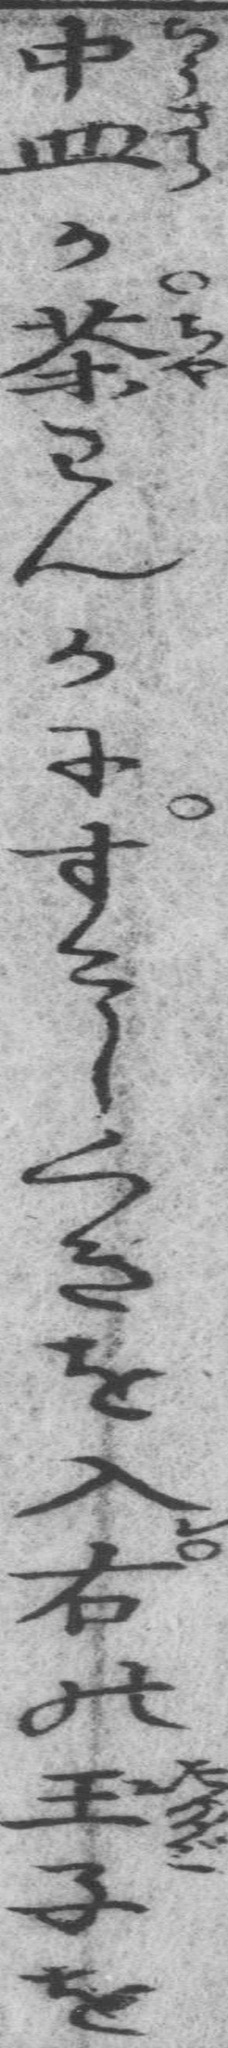中皿か。茶わんかに。すこしくきを入れ。右の玉子を
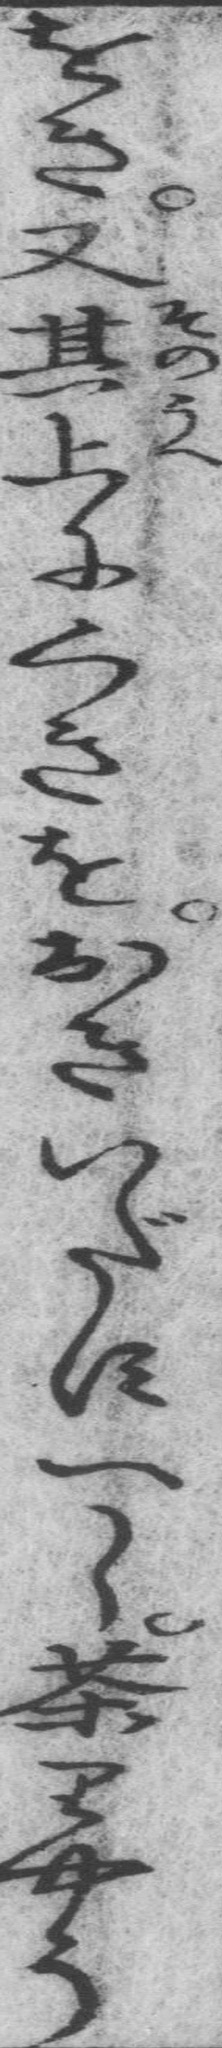をき。又其上にくきを。おきいだすへし。茶りやう
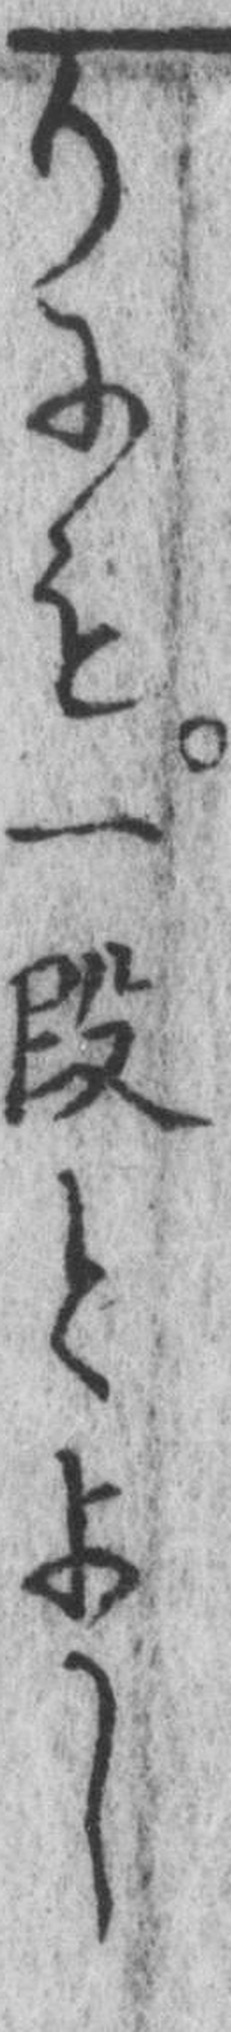りにも。一段とよし
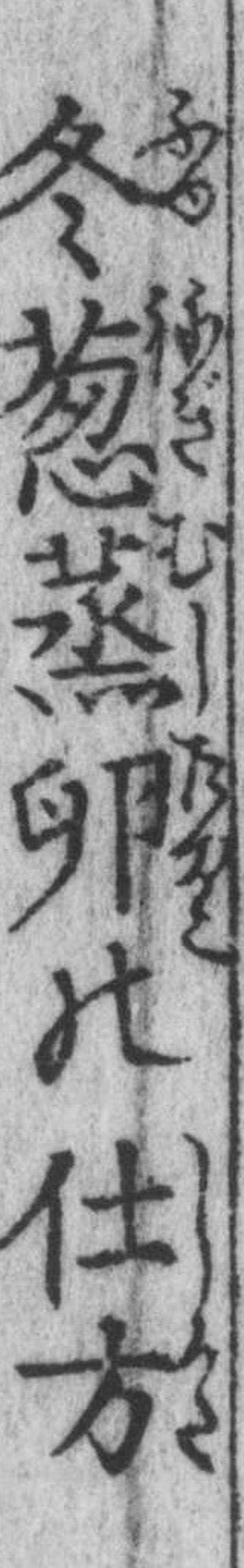冬葱蒸卵の仕方
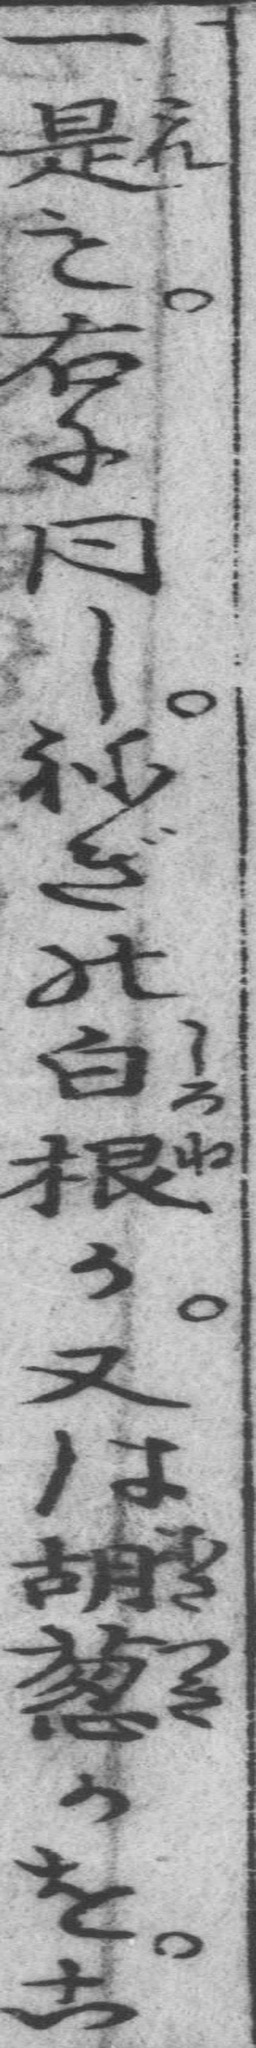一是も。右に同し。ねぎの白根か。又は胡葱かを。こ
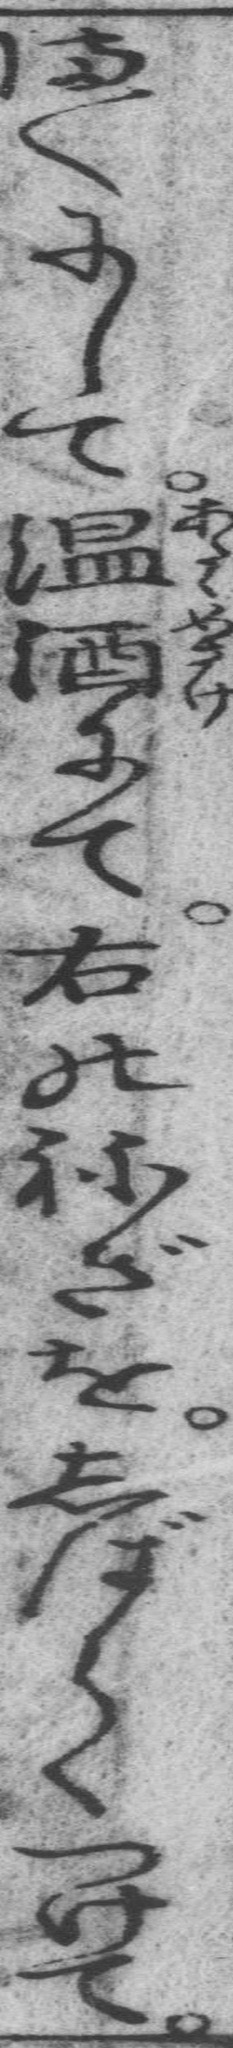ま〳〵にして。温酒にて。右のねぎを。しばらくつけて。
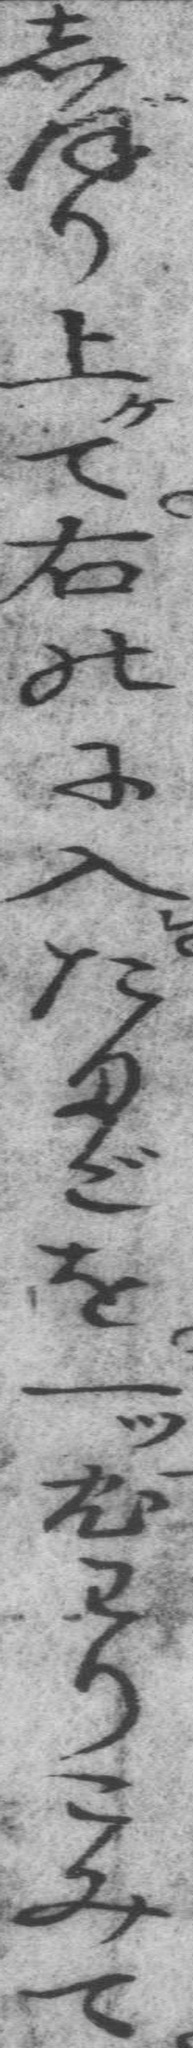しぼり上けて。右のに入れ。たまごを。一ツ宛わりこみて。

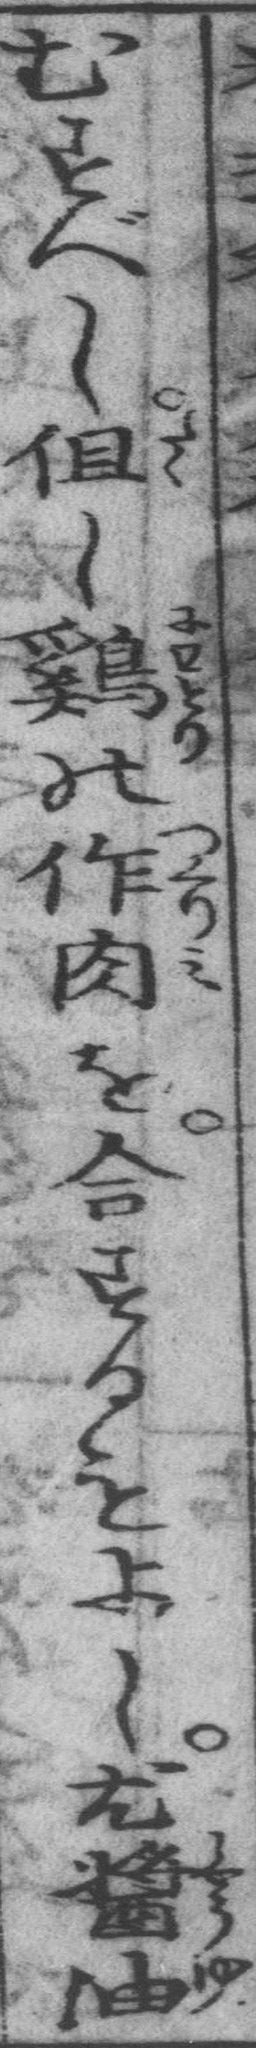むすべし。但し鶏の作肉を。合するもよし。尤醤油
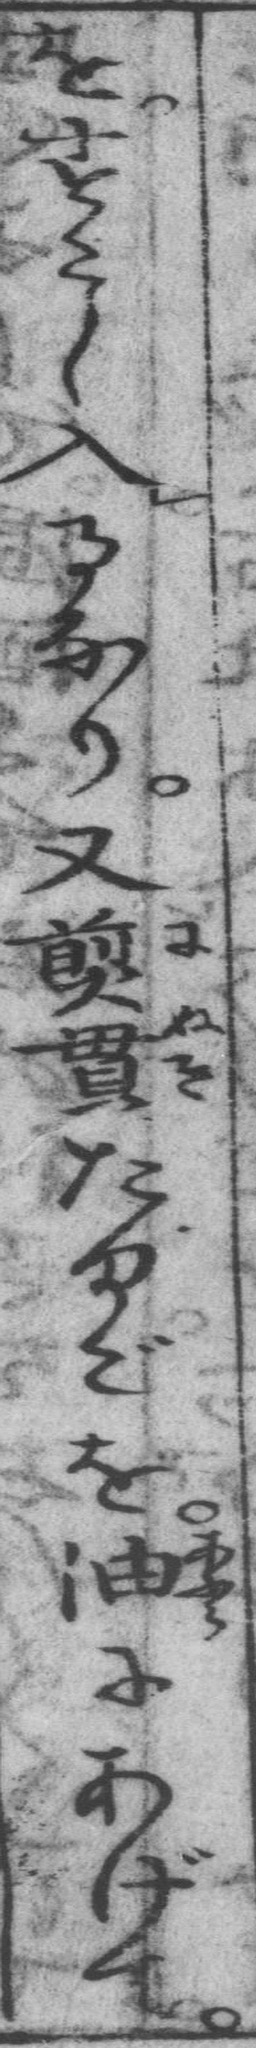を。すこし入れるなり。又煎貫たまごを。油にあげて。
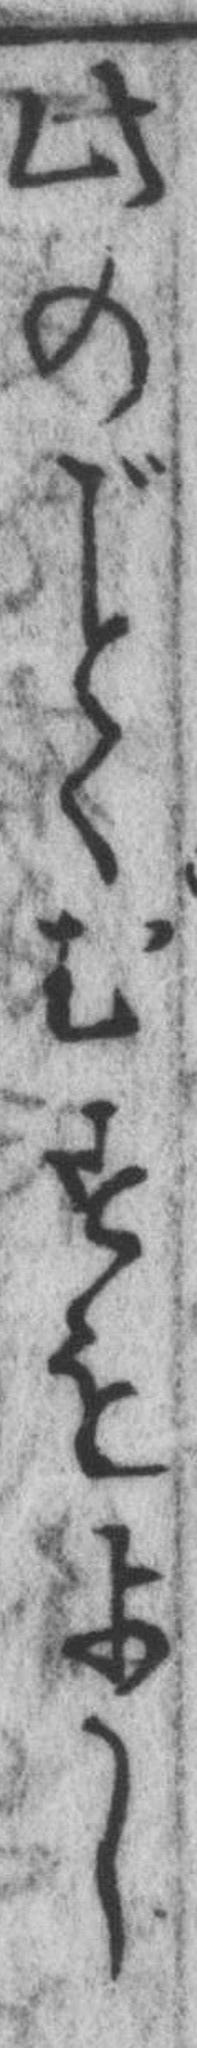此のごとく。むすもよし
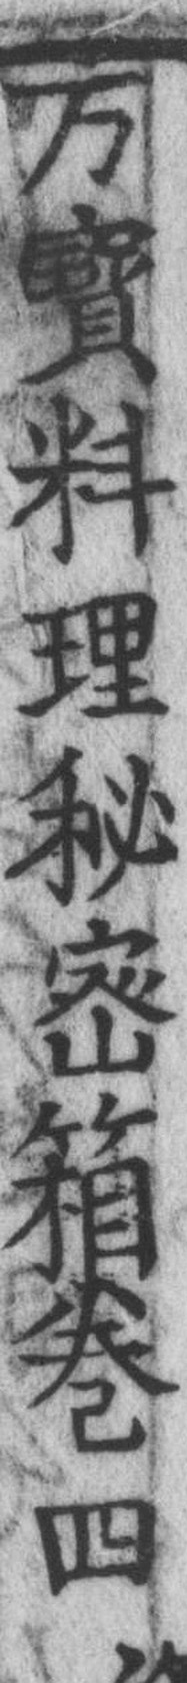万宝料理秘密箱巻四終
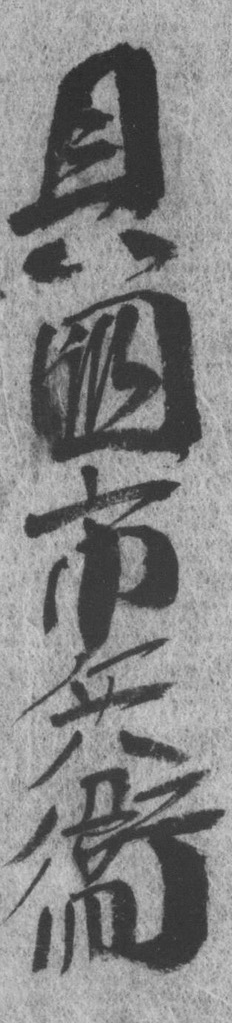貝国市兵衛

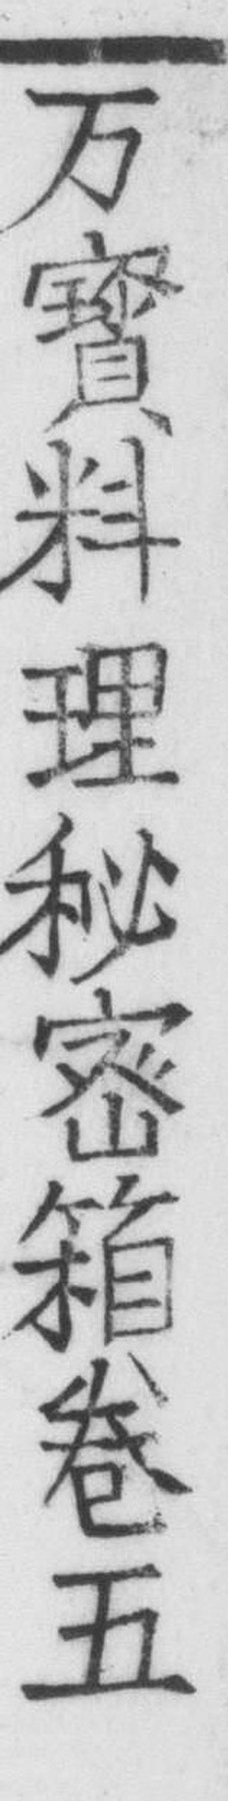万宝料理秘密箱巻五
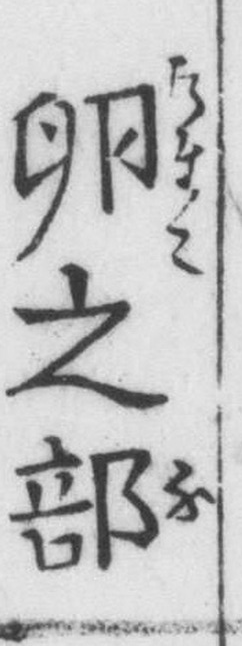卵の部
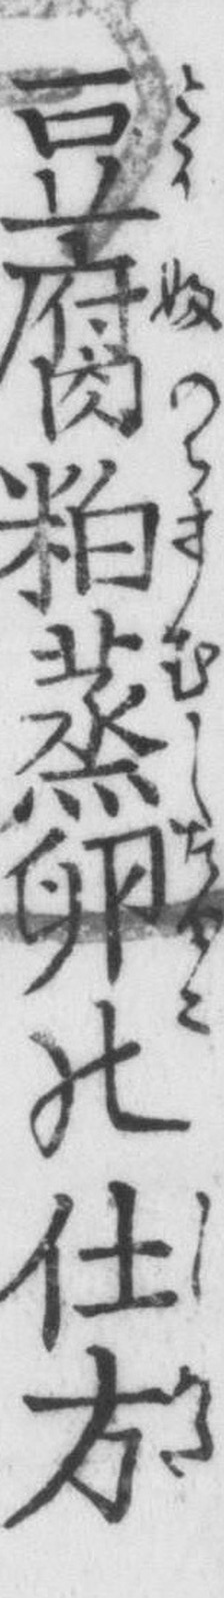豆腐粕蒸卵の仕方
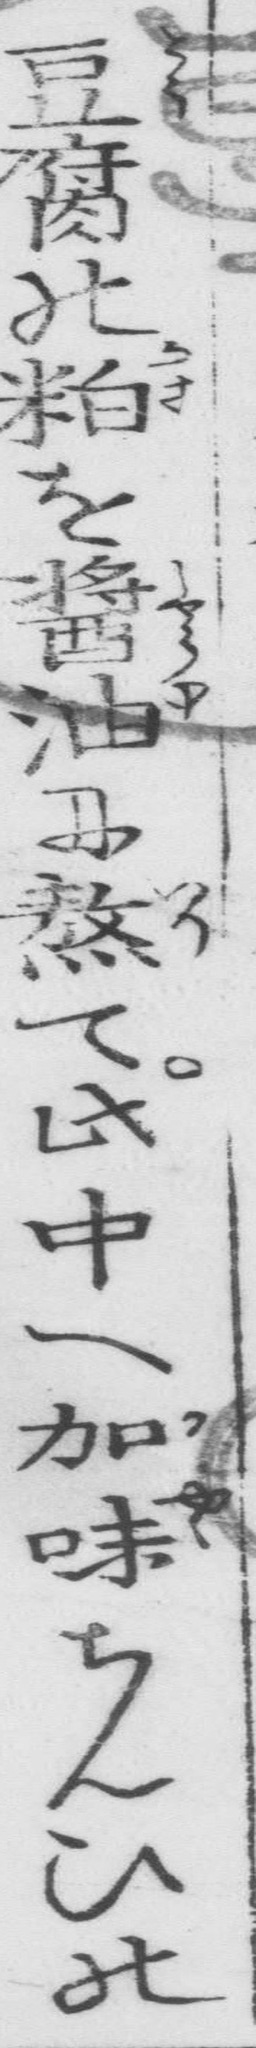一豆腐の粕を醤油に熬て。此中へ加味ちんひの
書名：萬寳料理秘密箱
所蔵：大阪府立大学学術情報センター 国文学研究資料館
